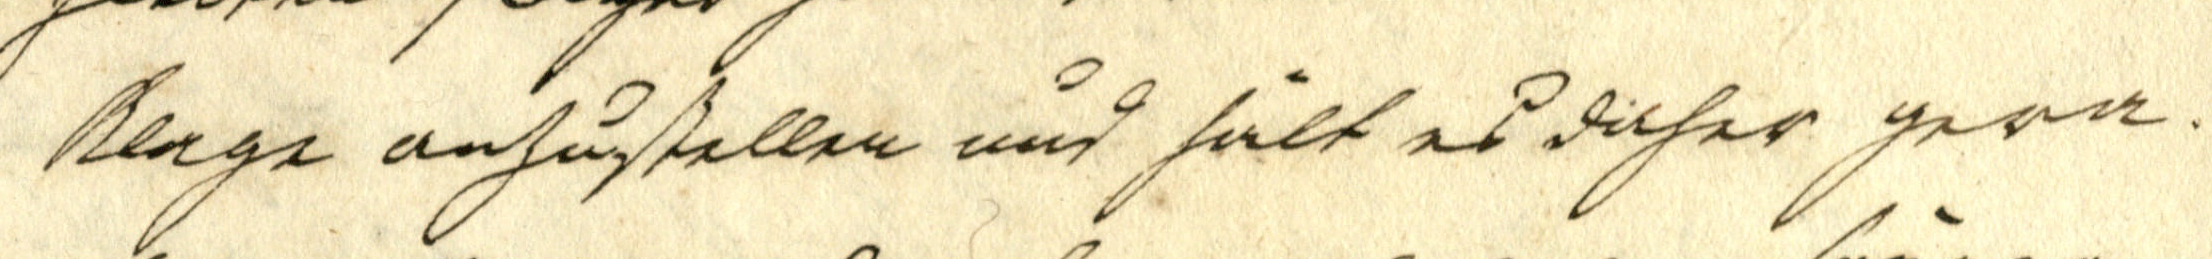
Klage anzustellen und hält es daher gera¬
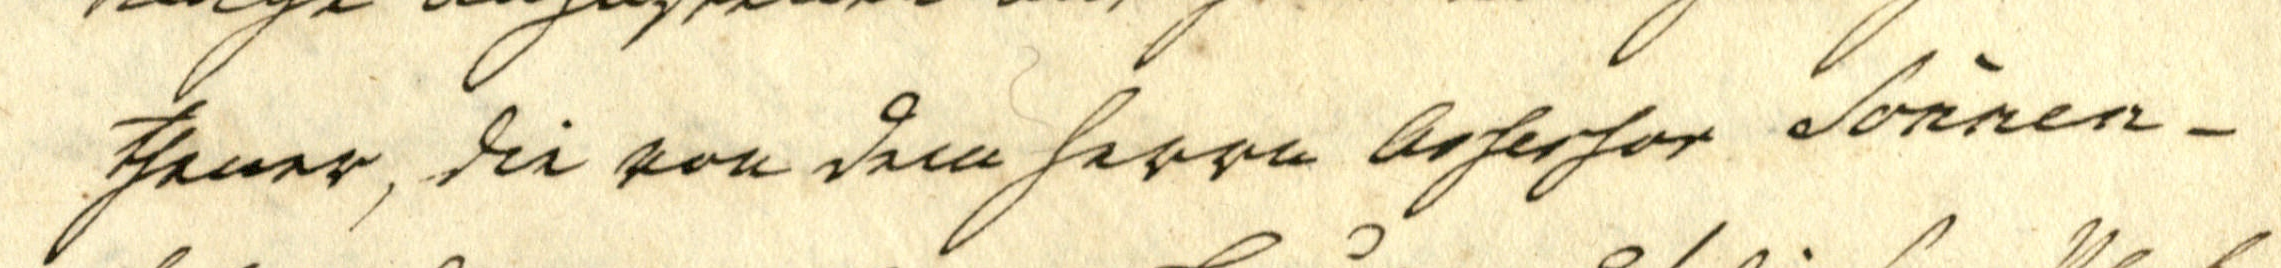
thener, die von dem herrn Assessor Sonnen¬
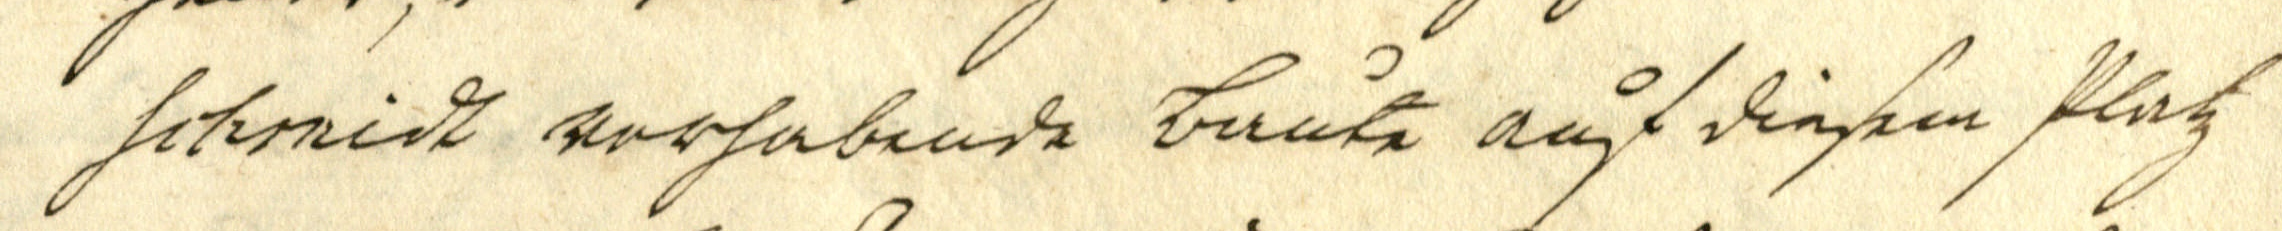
schmidt vorhabende Baute auf diesem Platz
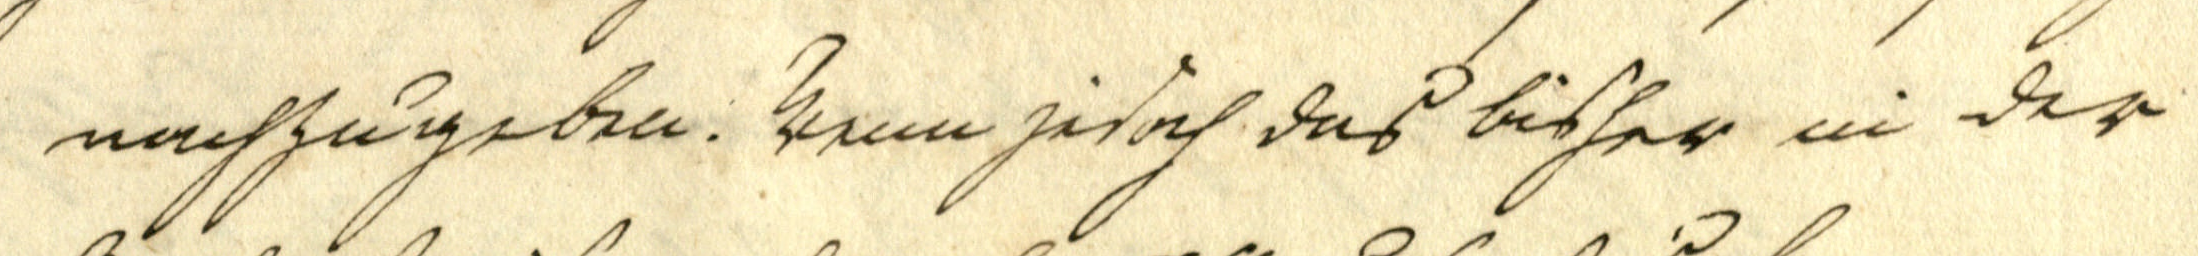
nachzugeben. Wenn jedoch das bisher in der
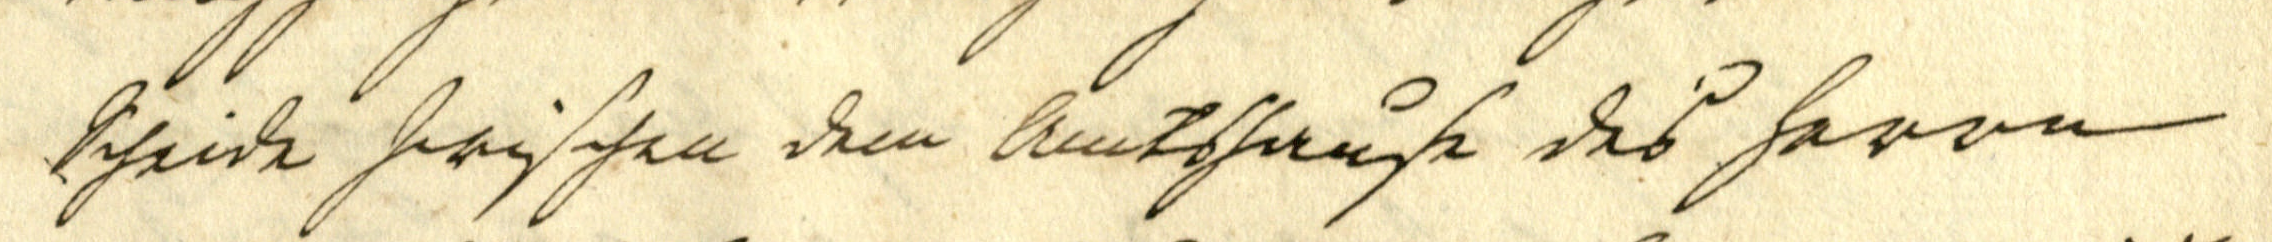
Scheide zwischen dem Amtshause des herrn
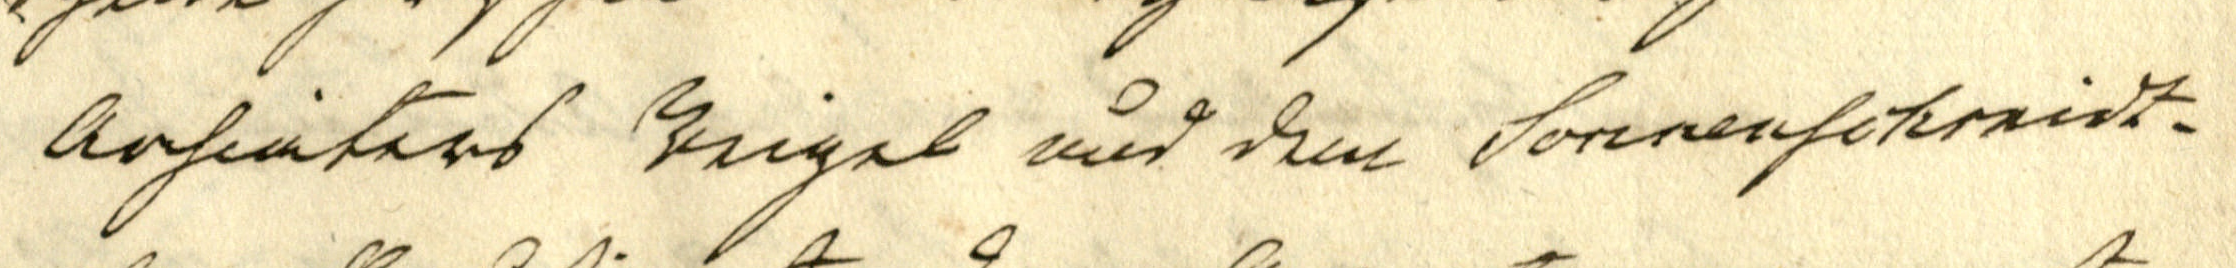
Archiaters Weigel und dem Sonnenschmidt¬
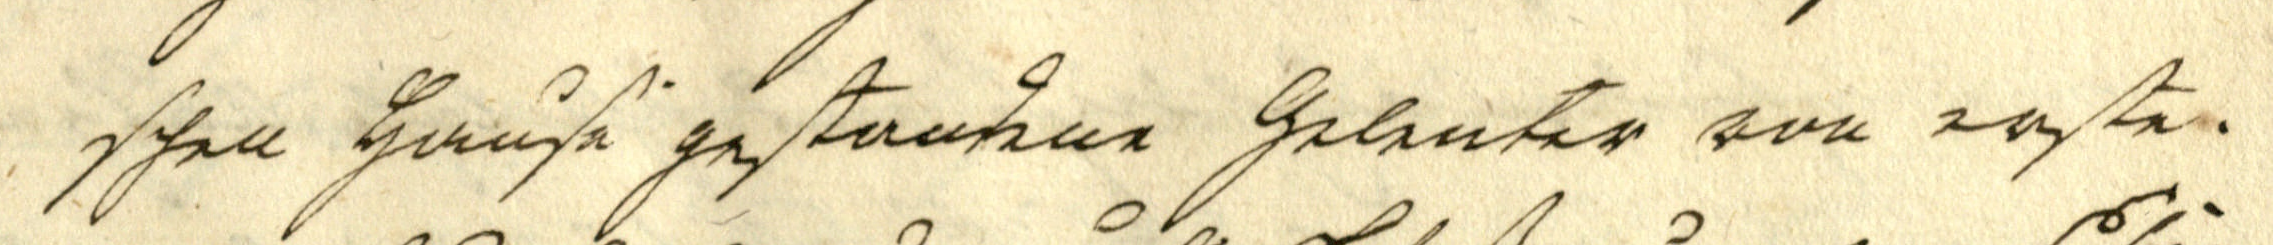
schen Hause gestandene Gelenter von erste¬
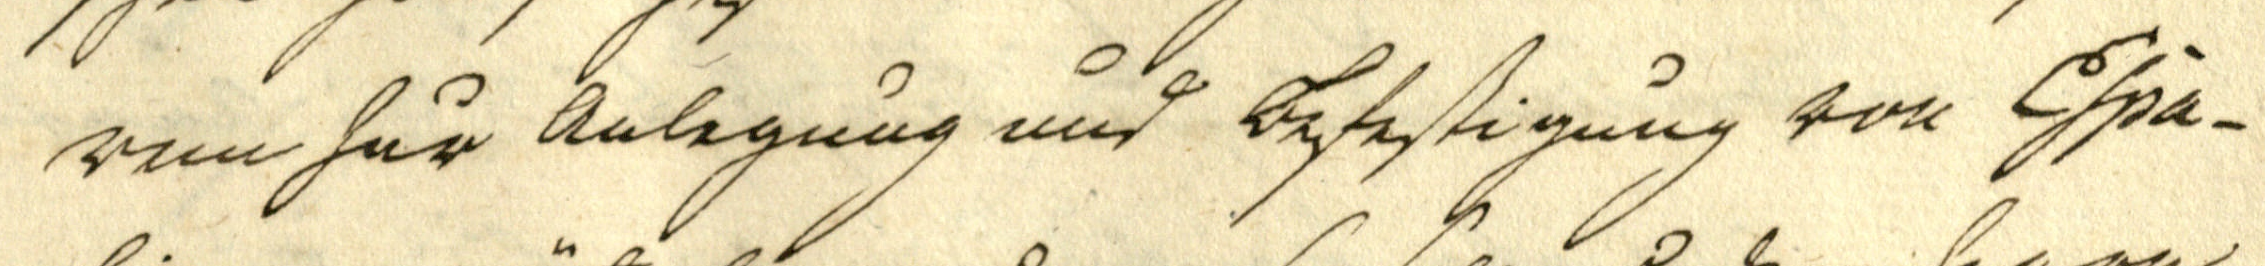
rem zur Anlegung und Befestigung von Espa¬
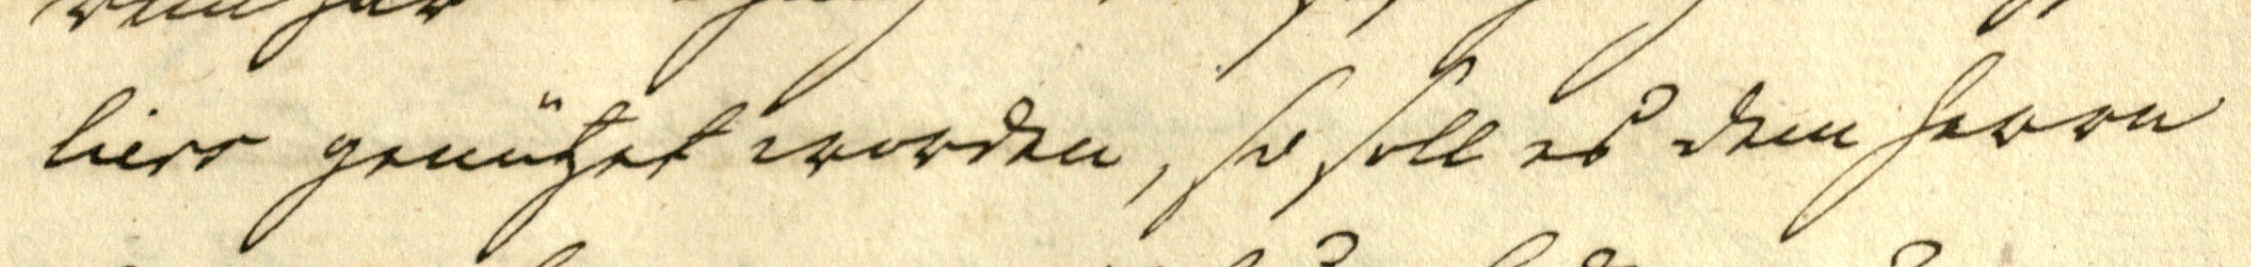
liers genützet worden, so soll es dem herrn
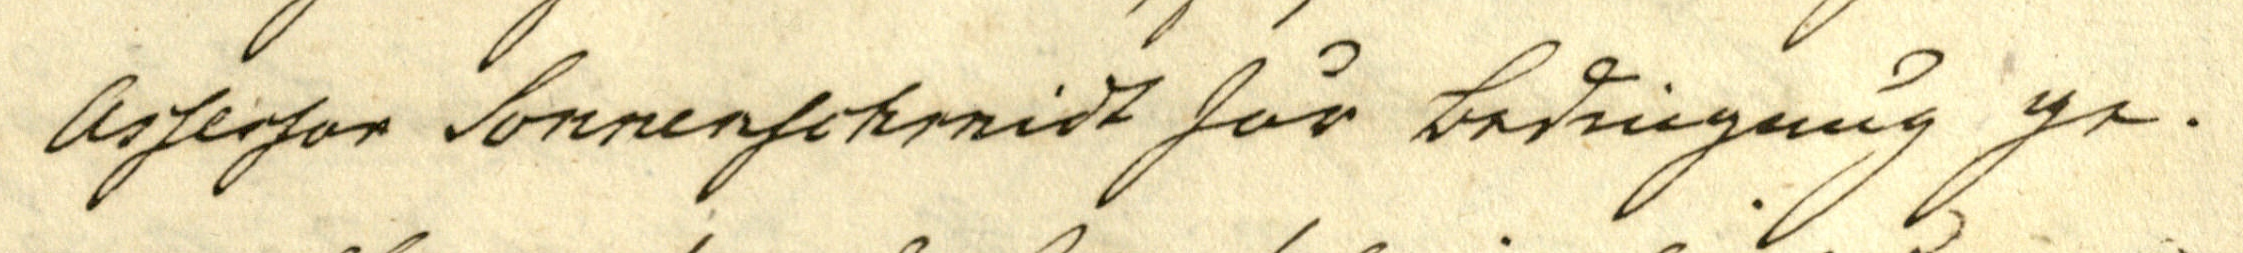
Assessor Sonnenschmidt zur Bedingung ge¬
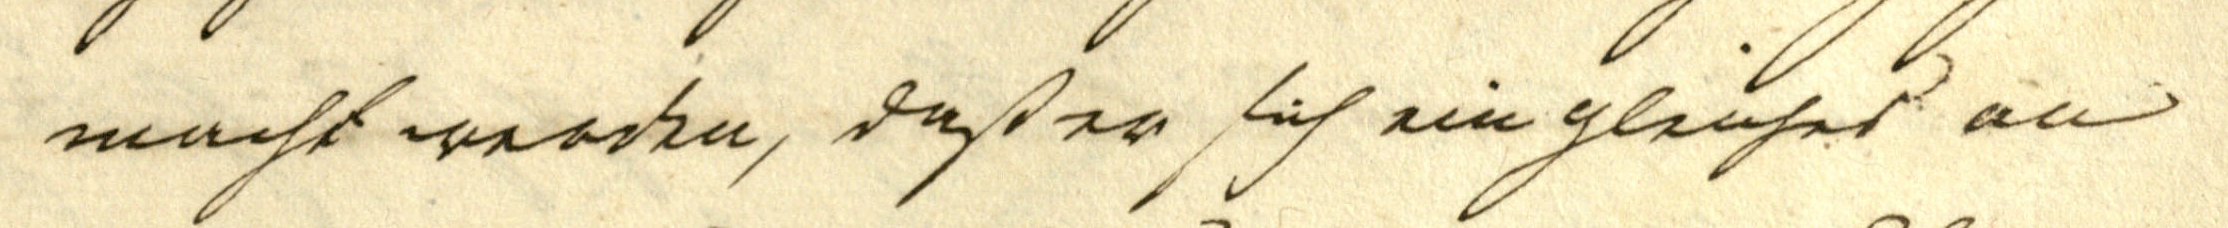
macht werden, daß er sich ein gleiches an
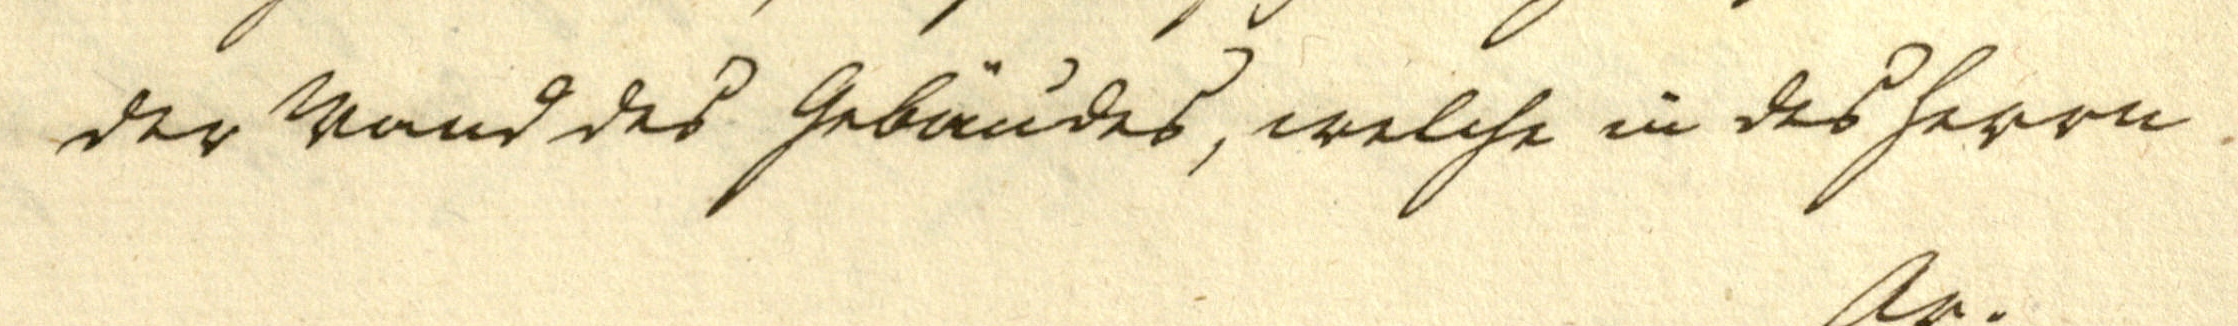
der Wand des Gebäudes, welche in des herrn
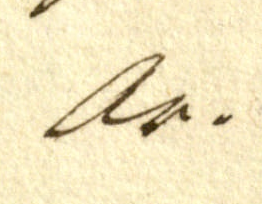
Ar
